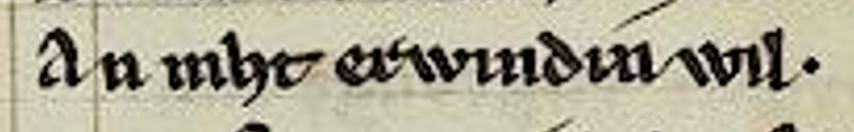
An niht erwindin wil.
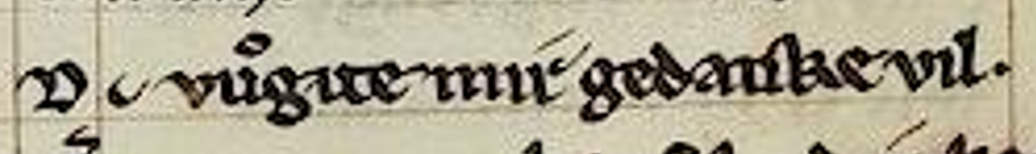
D(az) vu°ogite mir gedanke vil.
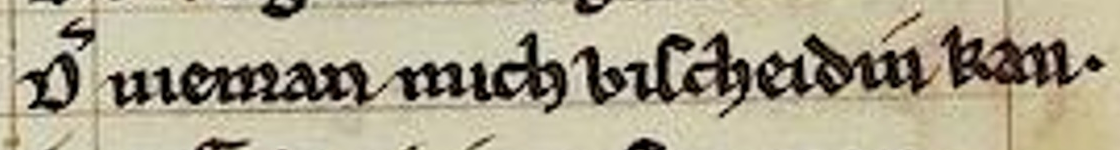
D(er) nieman mich biſcheidin kan.
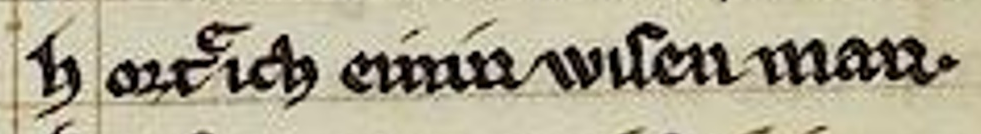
Hort°(e) ich einin wiſen man.
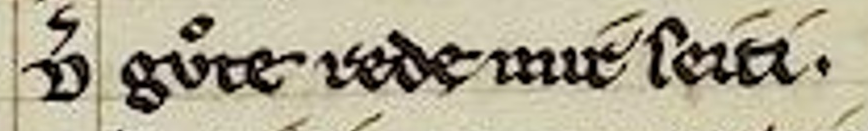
D(er) gv°ote rede mir ſeiti.
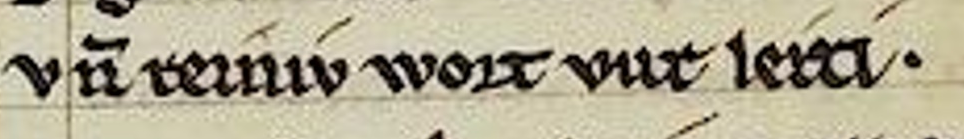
Vn(d) reiniv wort vur leiti.
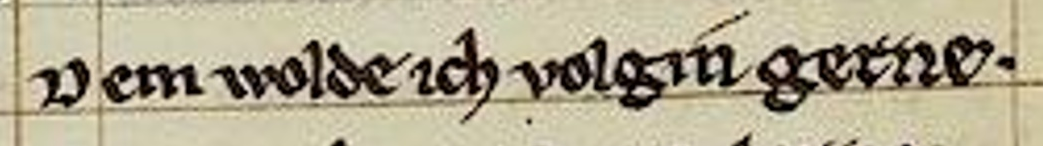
Dem wolde ich volgin gerne.
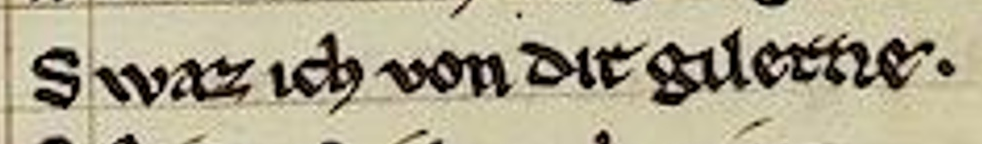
Swaz ich von dir gilerne.
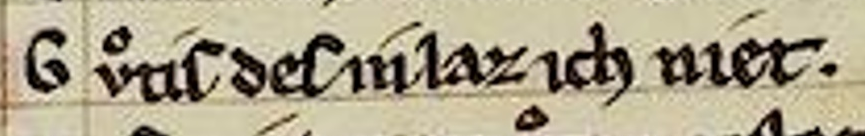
Gv°otiſ deſ inlaz ich niet.
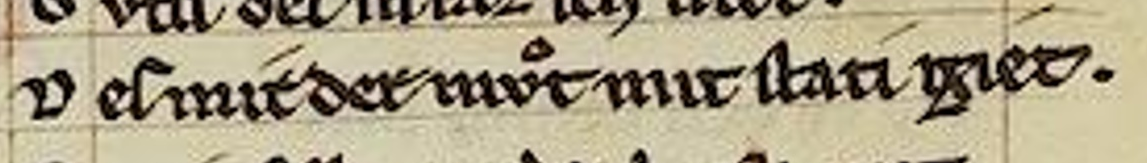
Deſ mir der mv°ot mit ſtati giet.
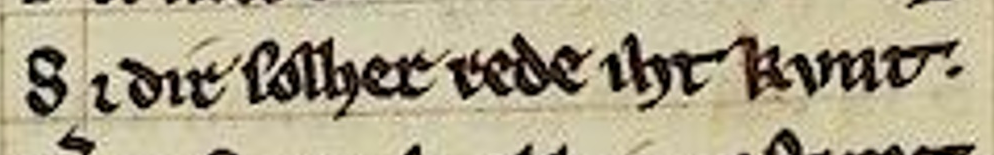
Si dir ſolher rede iht kvnt.
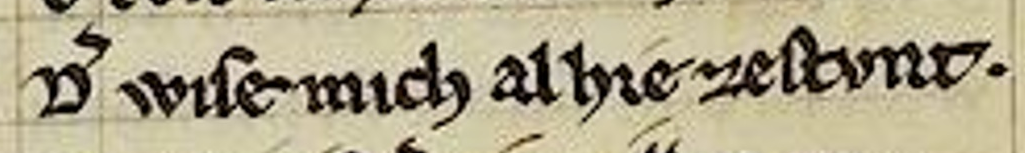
D(er) wiſe mich al hie zeſtvnt.
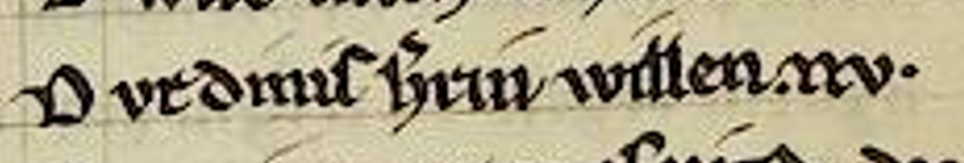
Dvr diniſ h(er)rin villen. nv.
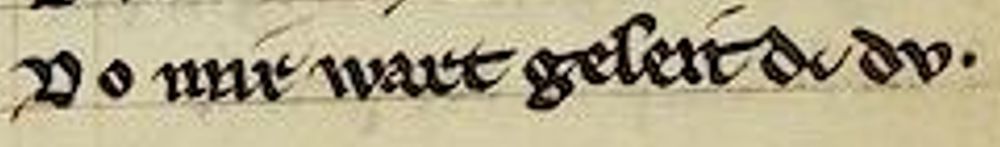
Do mir wart geſeit d(az) dv.
